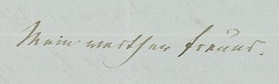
Mein werther Freund.
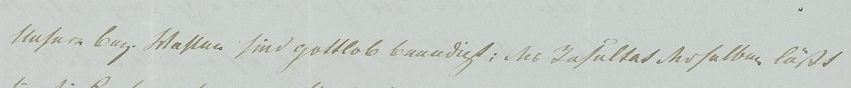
Unsere Bez. Wahlen sind gottlob beendigt; das Resultat derselben läßt
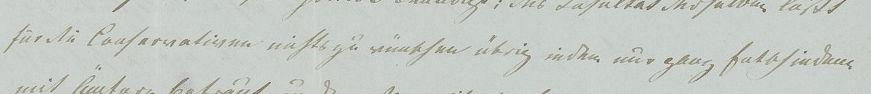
für die Conservativen nichts zu wünschen übrig indem nur ganz Entschiedene
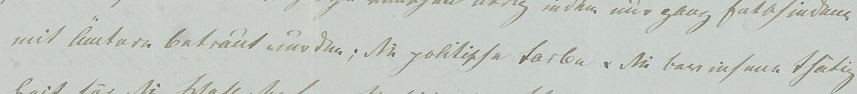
mit Ämtern betraut wurden; die politische Farbe & die bewiesene Thätig-
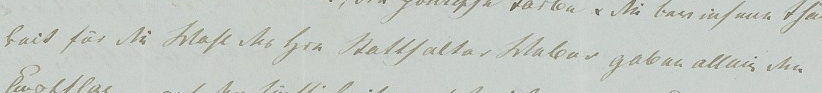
keit für die Wahl des Hrn Statthalter Weber gaben allein den
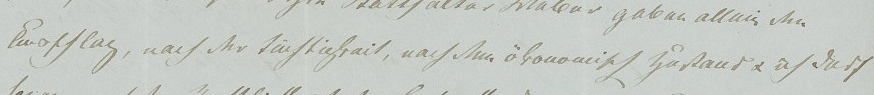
Ausschlag, nach der Tüchtigkeit, nach den ökonomischen Zustand & ich darf
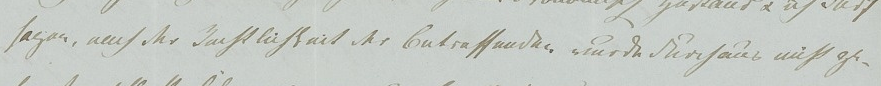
sagen, nach der Rechtlichkeit der Betreffenden wurde durchaus nicht ge-
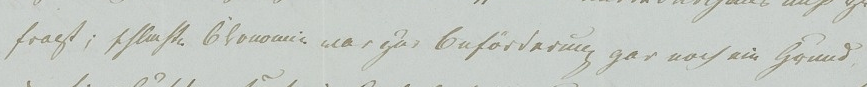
fragt; schlechte Ökonomie war zur Beförderung gar noch ein Grund,
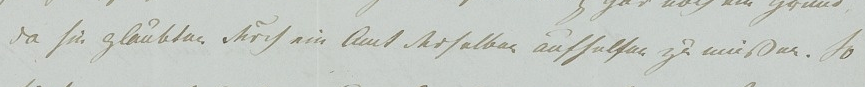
da sie glaubten durch ein Amt derselben aufhelfen zu müßen. So
